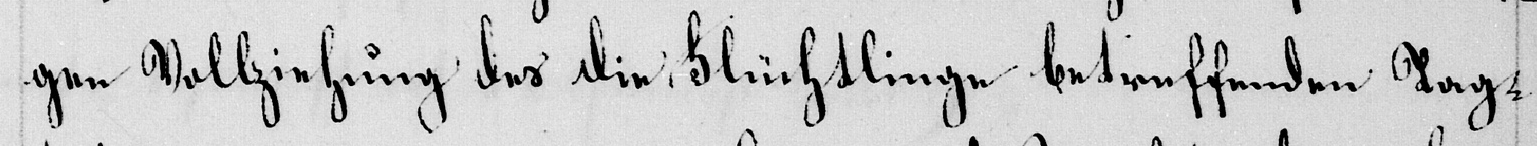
gen Vollziehung des die Flüchtlinge betreffenden Tag¬
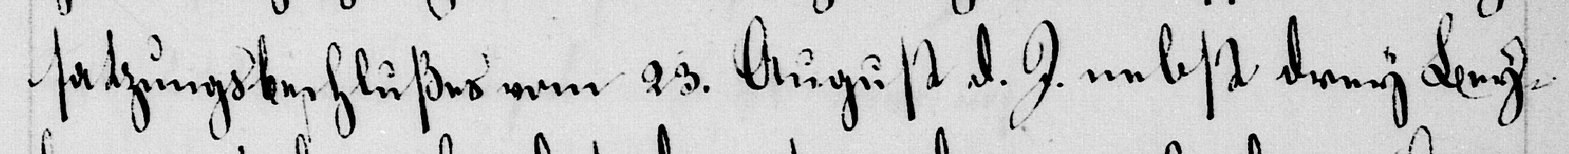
satzungsbeschlußes vom 23. August d. J. nebst drey Bey¬
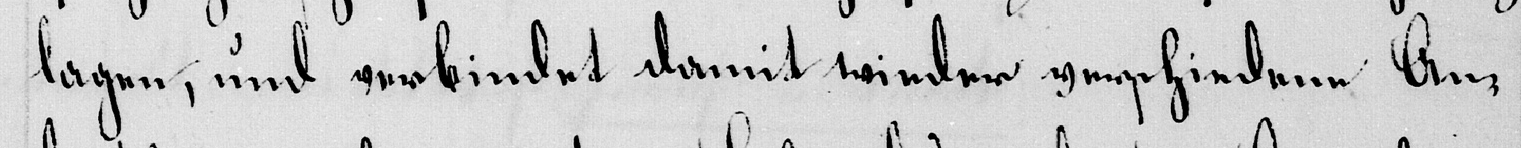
lagen, und verbindet damit wieder verschiedene An¬
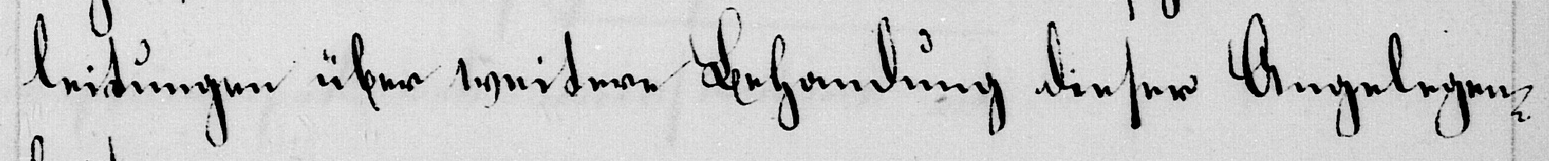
leitungen über weitere Verhandlung dieser Angelegen¬
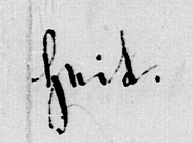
heit.
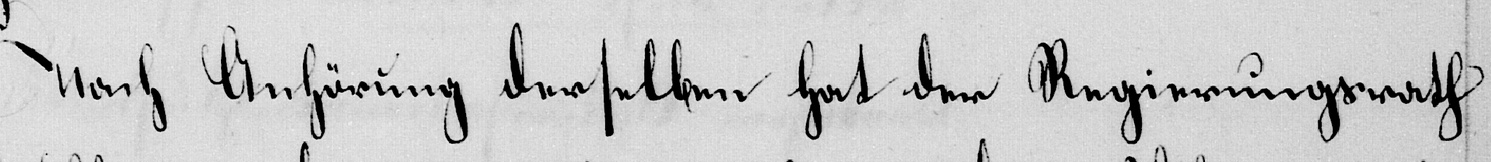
Nach Anhörung derselben hat der Regierungsrath
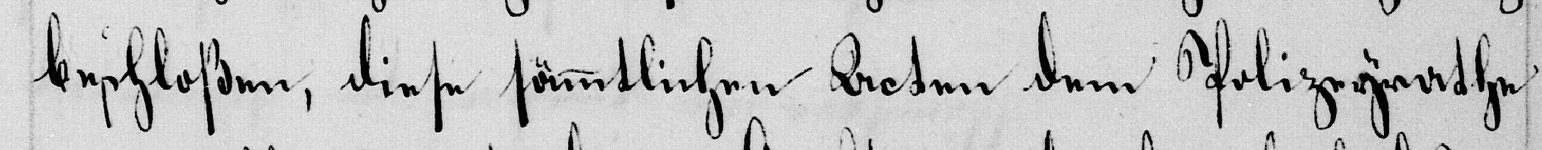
beschloßen, diese sämmtlichen Acten dem Polizeyrathe
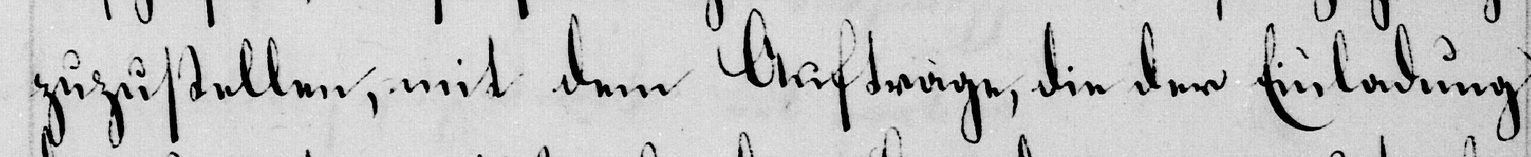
zuzustellen, mit dem Auftrage, die der Einladung
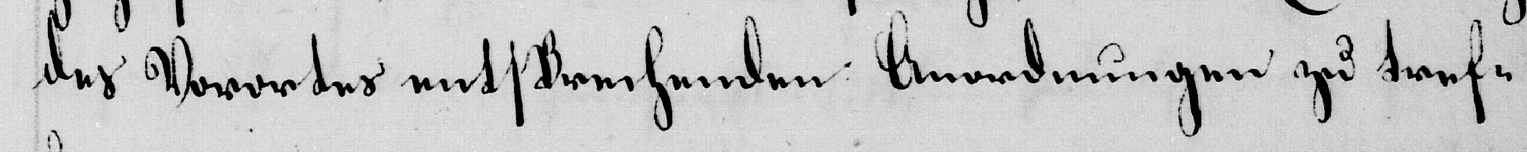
des Vorortes entsprechenden Anordnungen zu tref¬
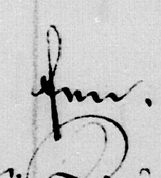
fen.
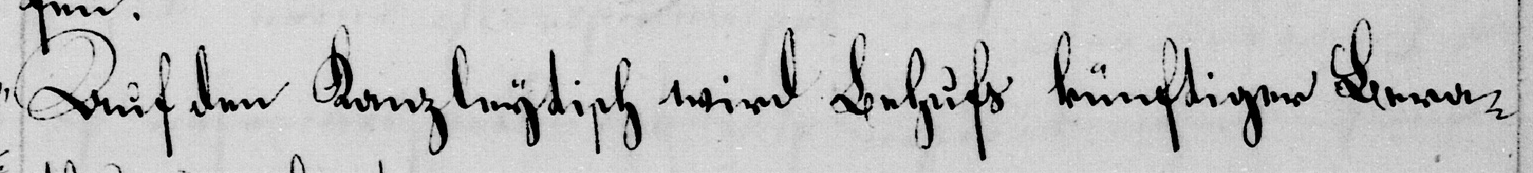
Auf den Kanzleytisch wird Behufs künftiger Bera¬
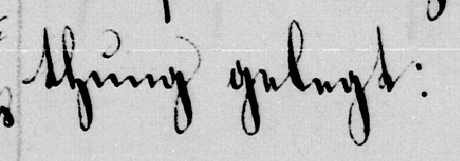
thung gelegt:
